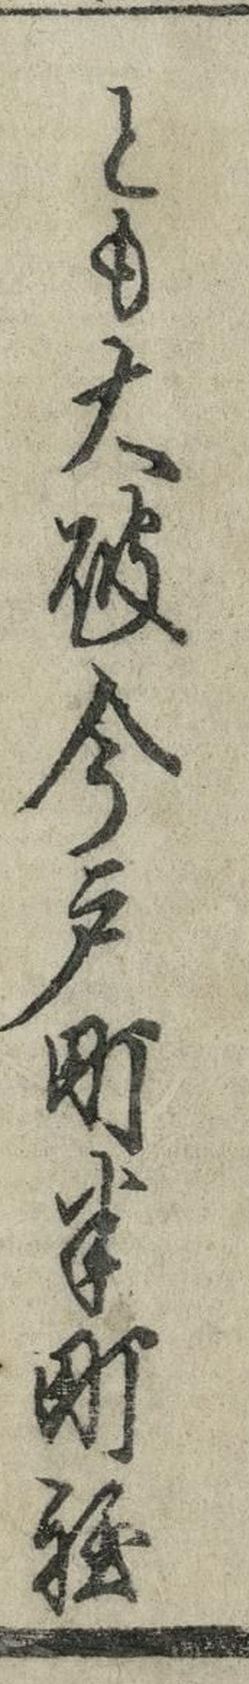とも大破今戸町半町程
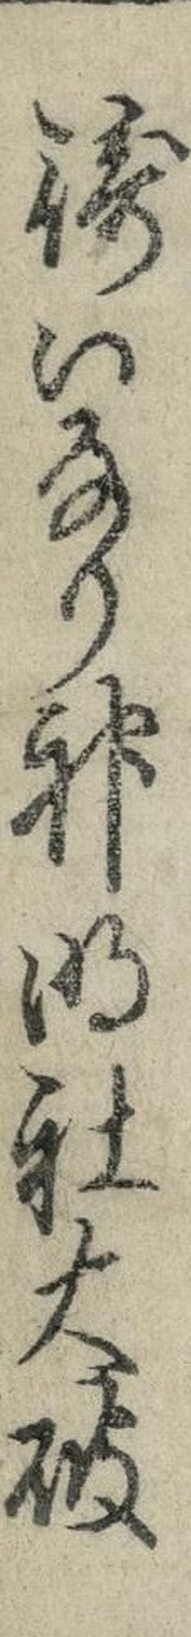崎いなり神明社大破
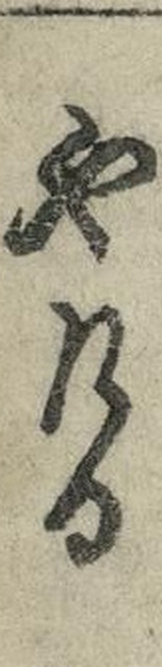やける
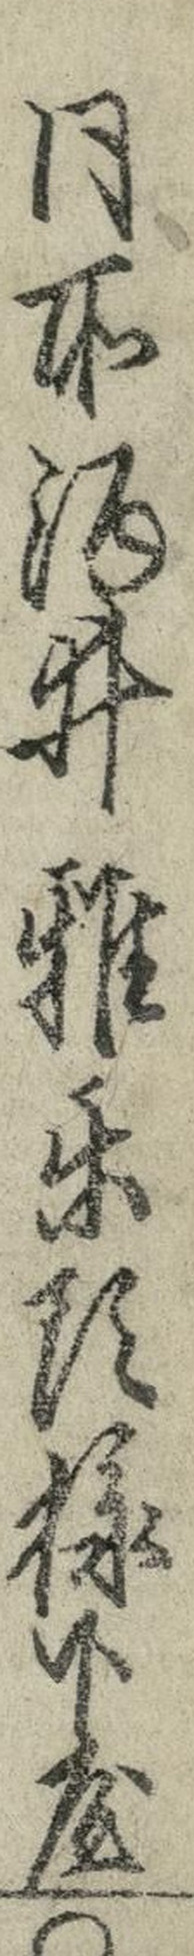同所酒井雅楽頭様下屋
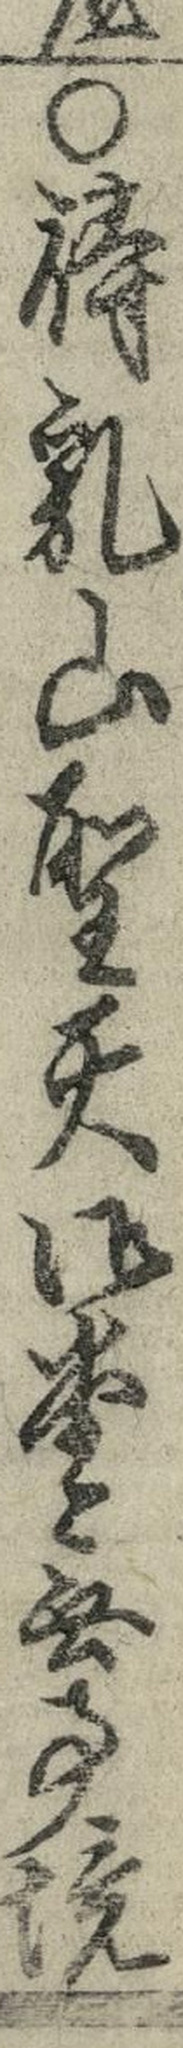○待乳山聖天御堂無事境
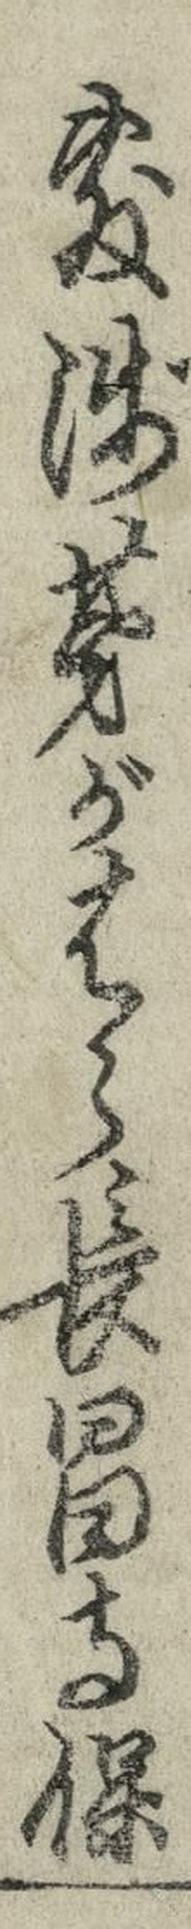敷浅茅がはら長昌寺保
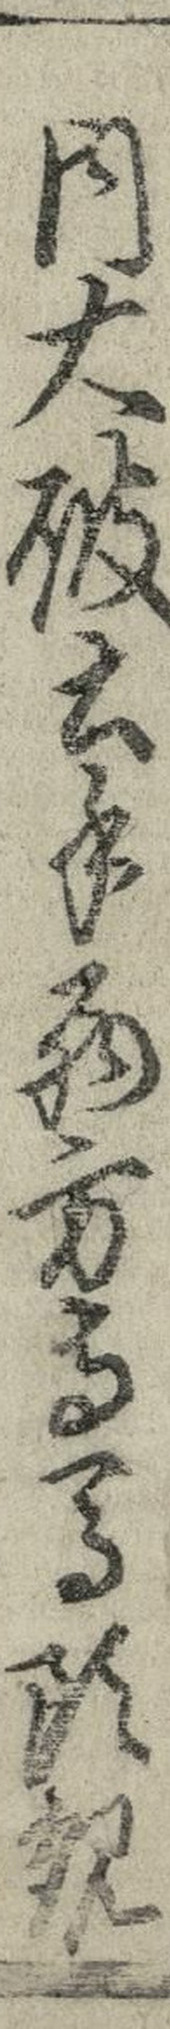内大破土手西方寺馬頭観
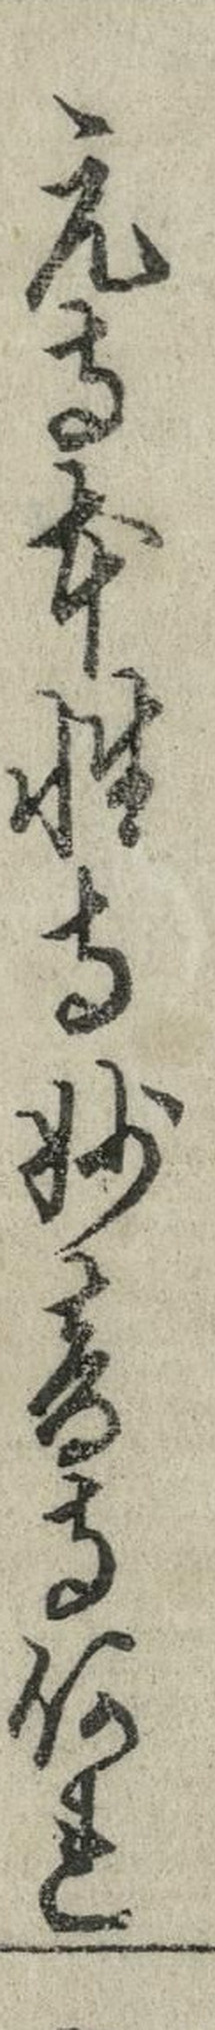元寺本性寺妙音寺何れ
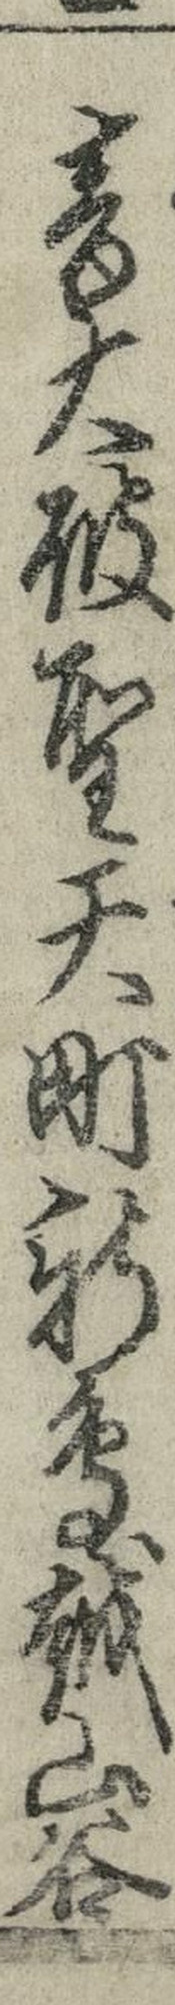音大破聖天町新鳥越山谷
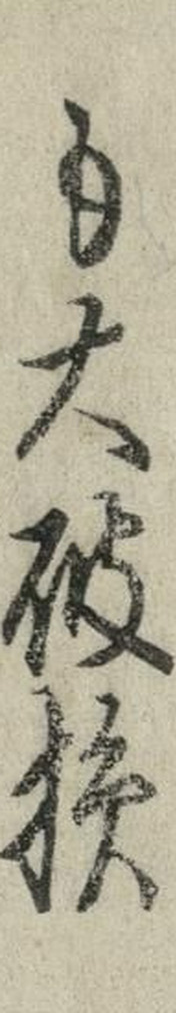も大破損
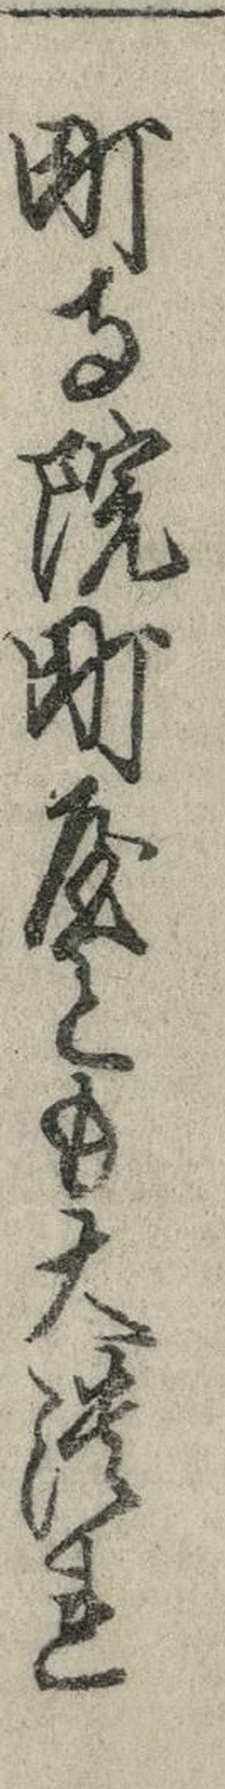町寺院町屋とも大潰れ
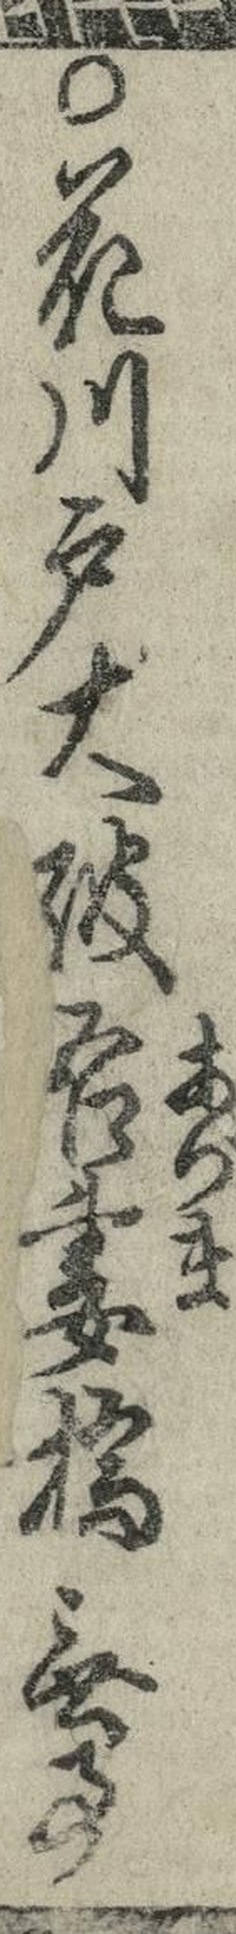○花川戸大破吾妻橋無事
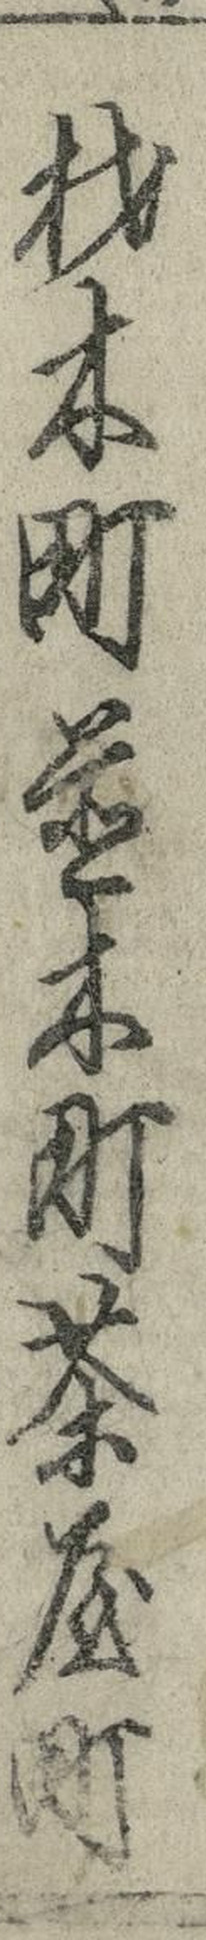材木町並木町茶屋町
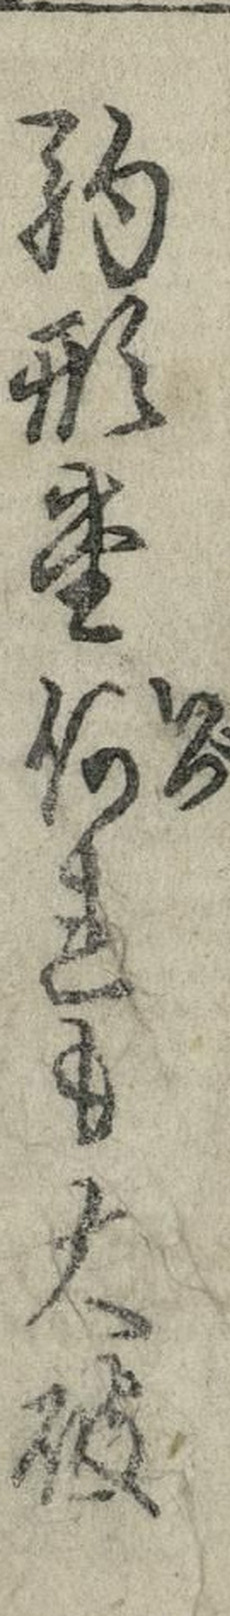駒形堂何れも大破
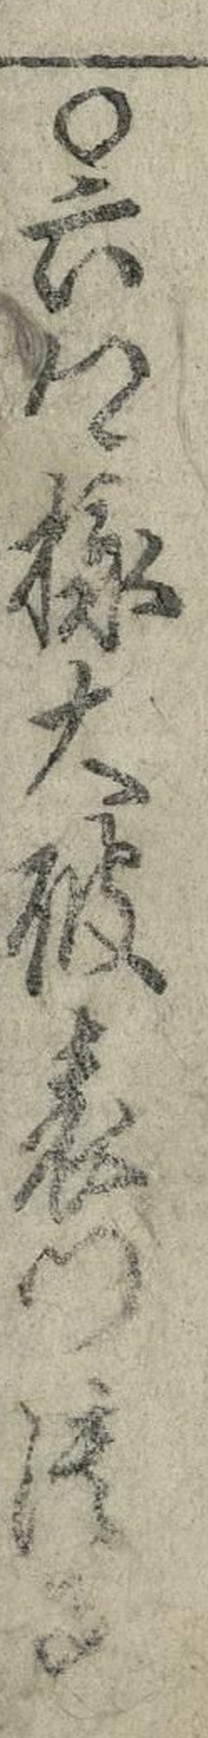○六郷様大破表門潰る

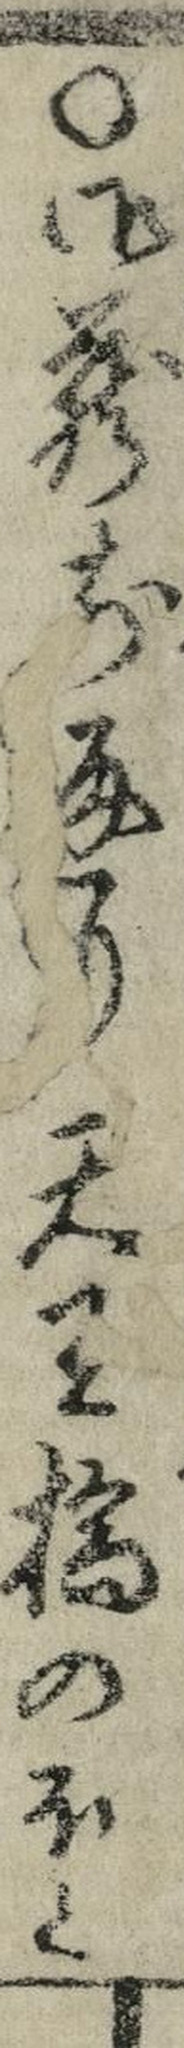○御蔵前通り天王橋のほと
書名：江戸　大地震末代噺の種　全
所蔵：東京大学地震研究所図書室 Earthquake Research Institute Library, The University of Tokyo, JAPAN
